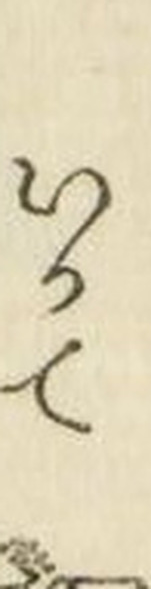いかて
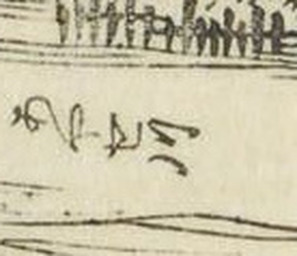あやせ川

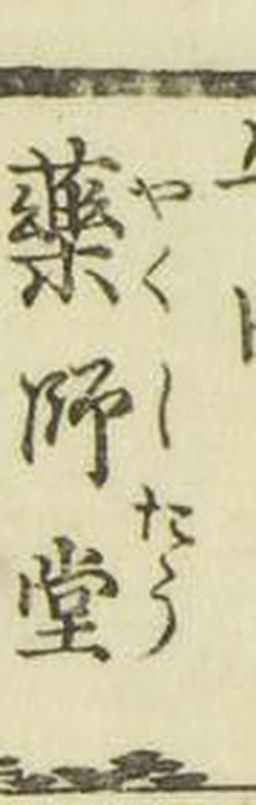薬師堂
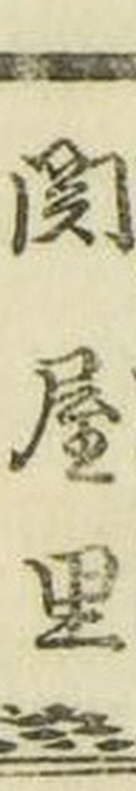関谷里
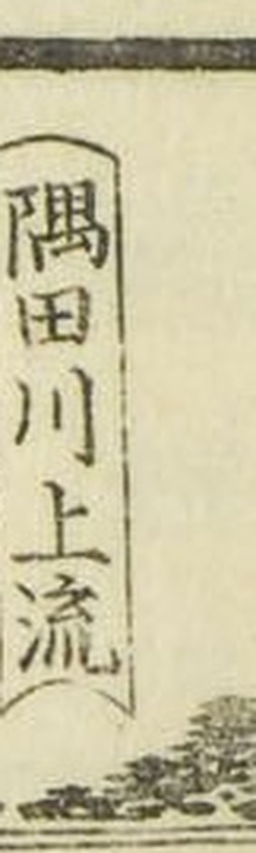隅田川上流
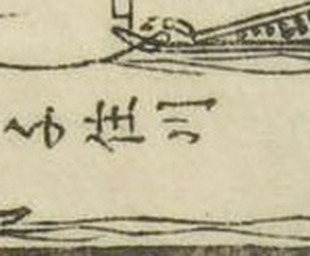千住川
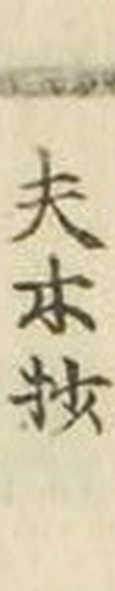夫木抄
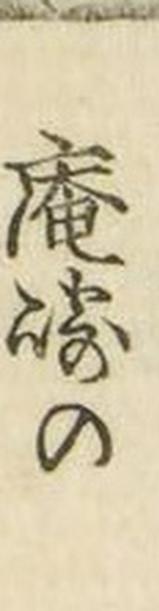庵崎の
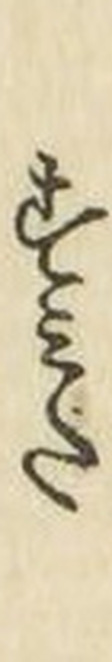すみた
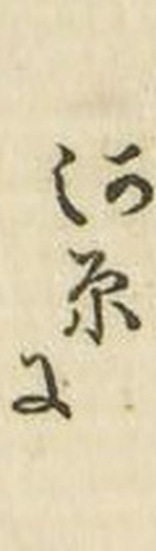河原に
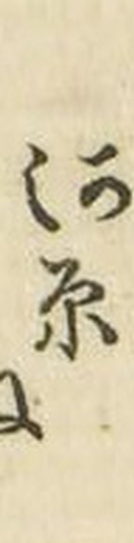河原に
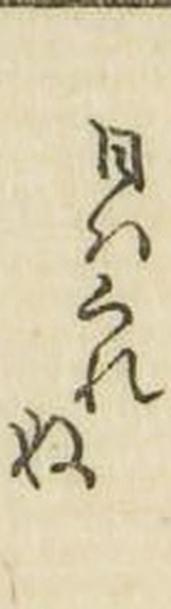日はくれぬ
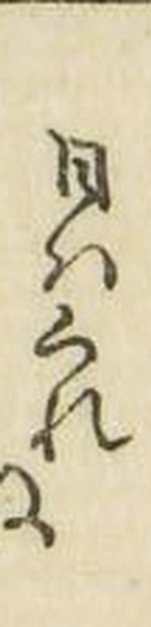日はくれぬ
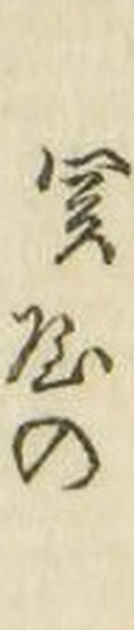関谷の

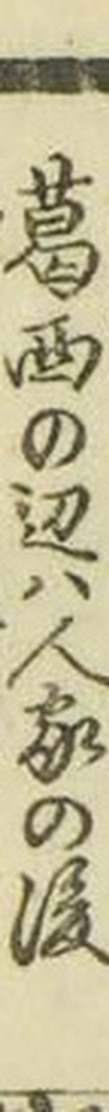葛西の辺は人家の後
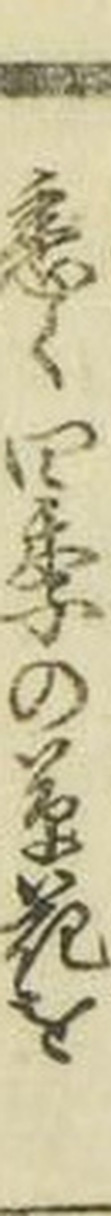悉く四季の草花を
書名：江戸名所図会 20巻 巻之19
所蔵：東京学芸大学教育コンテンツアーカイブ
